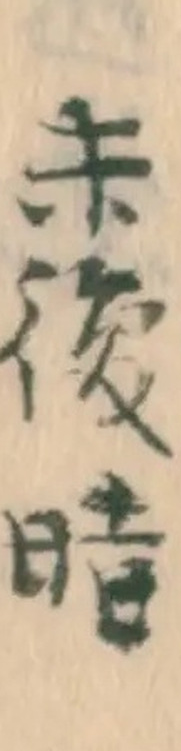未後晴
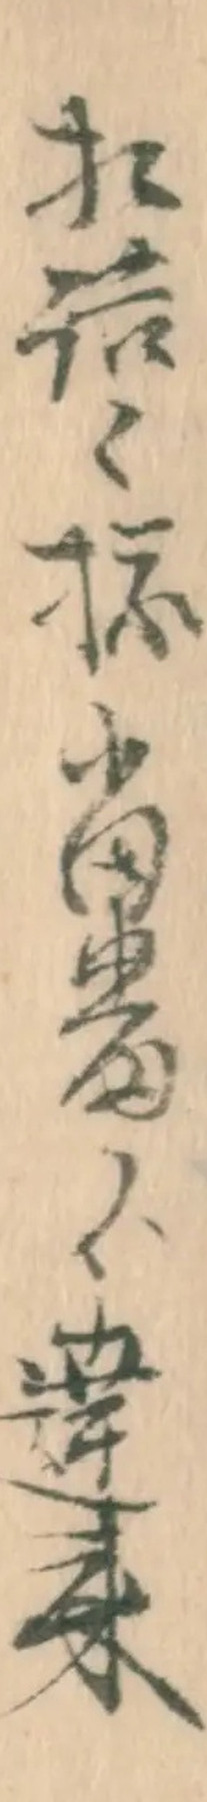相詰候様当番ゟ達来
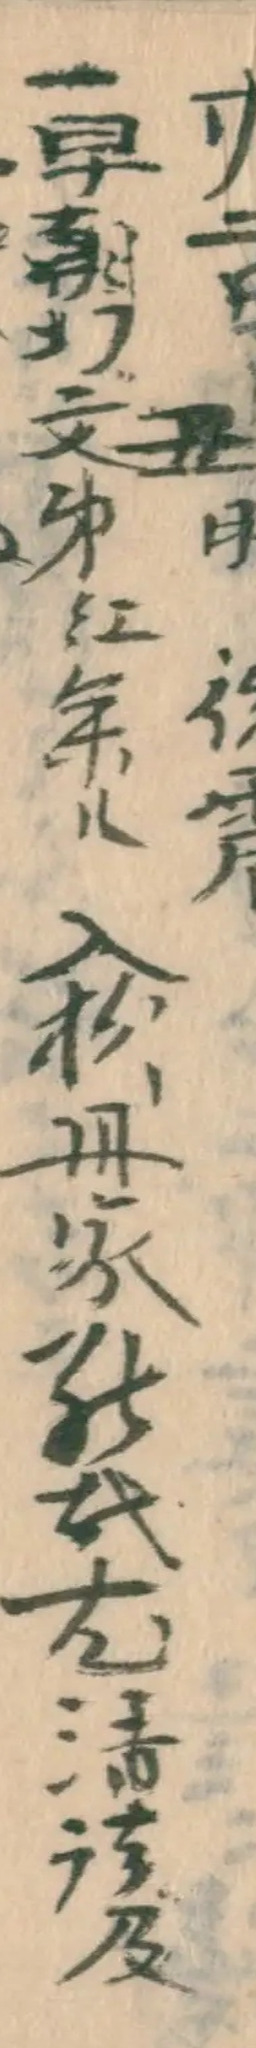一早朝光文第え参ル入夜丹家罷越尤清談及
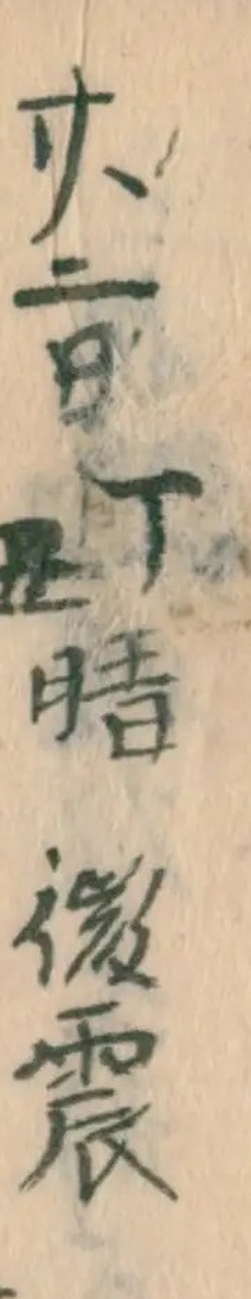廿二日丁丑晴微震
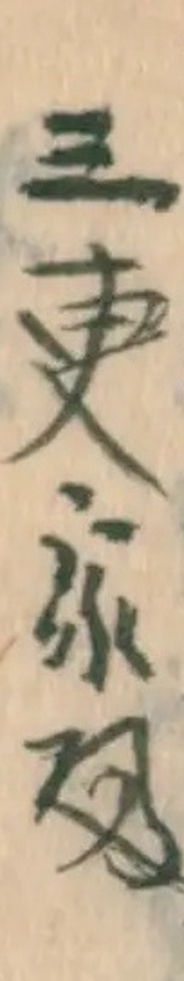三更家帰
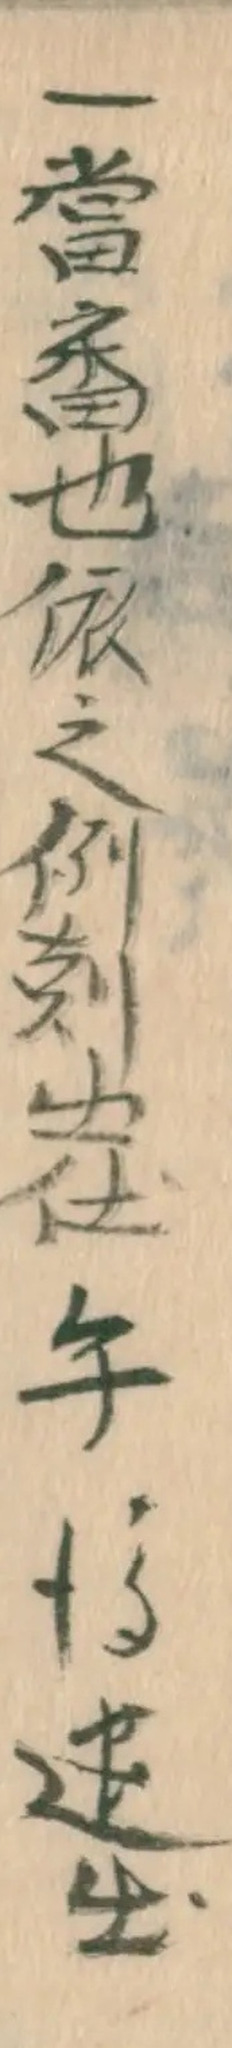一当番也依之例刻出仕午後退出
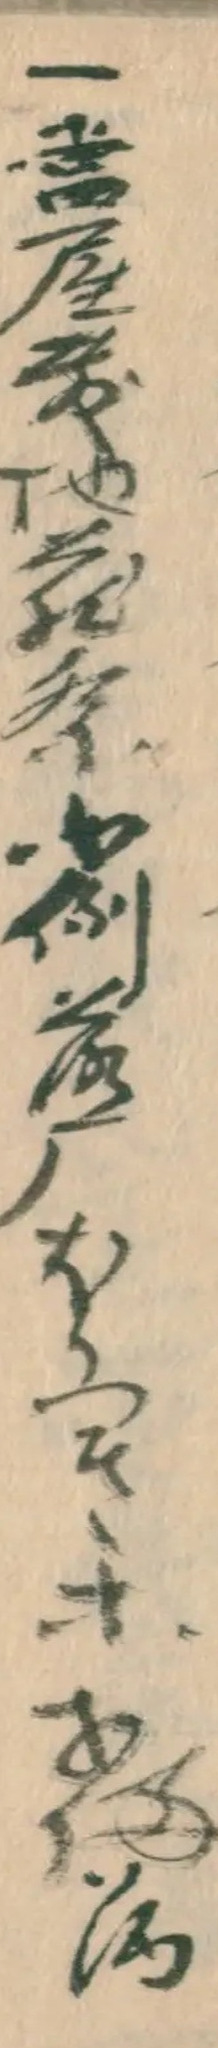一当屋敷地蔵祭如例落雁ほうつき等相備御酒
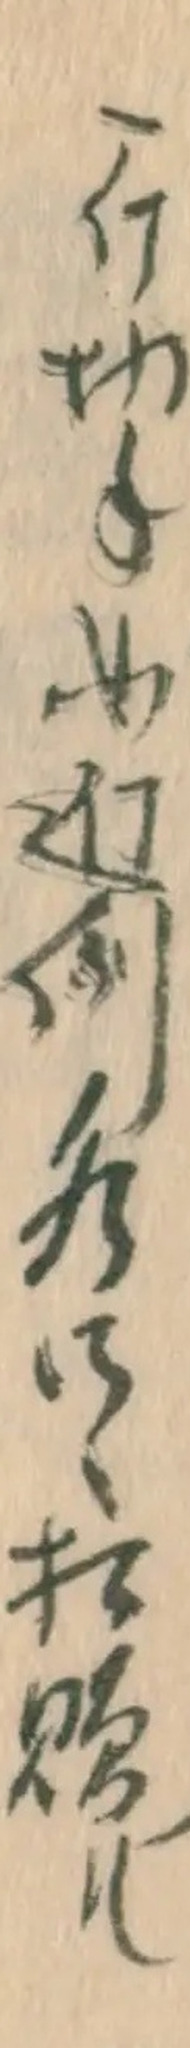一斤切手如近例水口へ相贈ル
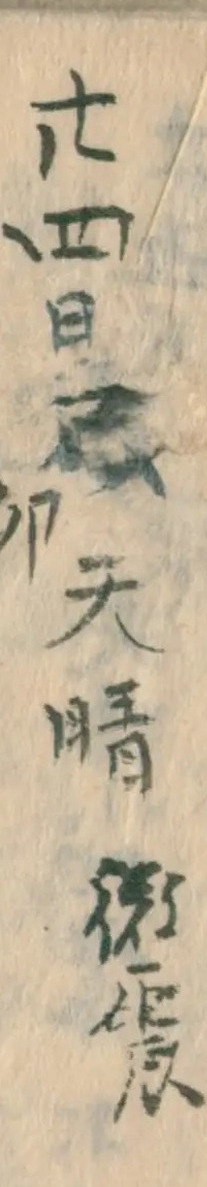廿四日己卯天晴微震
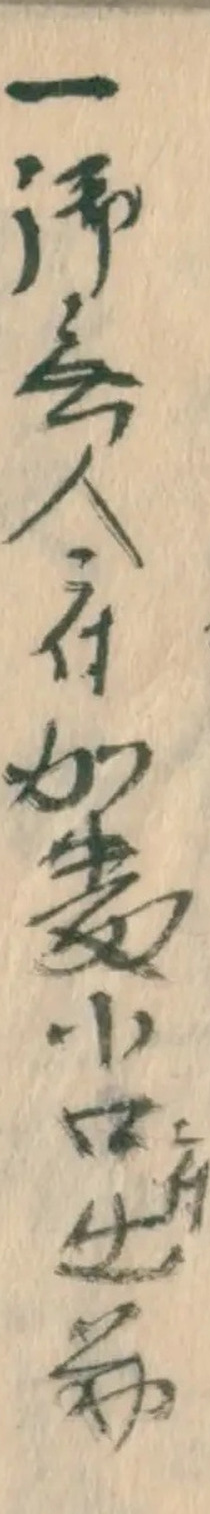一御無人ニ付加番小口ニ付出勤
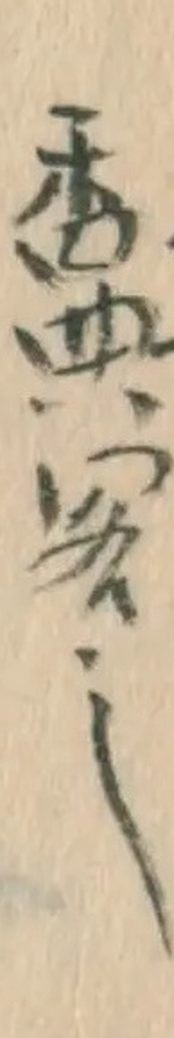香典略之
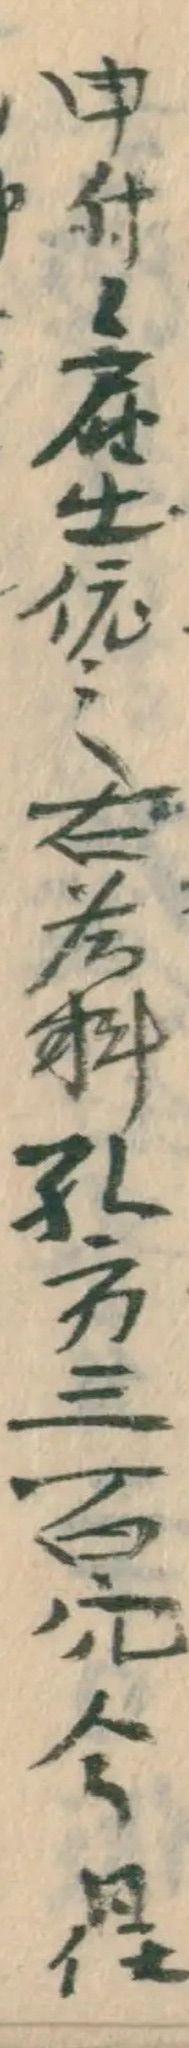申付候雇出依之右為料孔方三百穴今日任
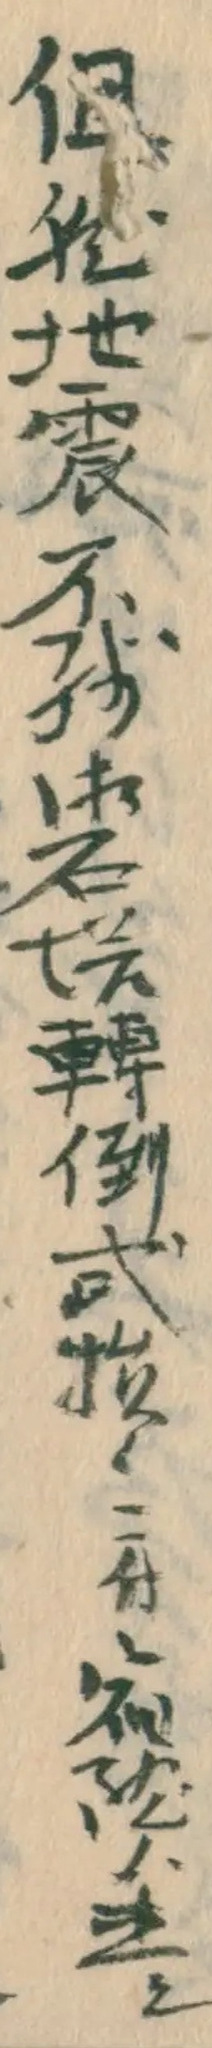但就地震不残御石塔転倒或損候ニ付宿院ゟ直シ
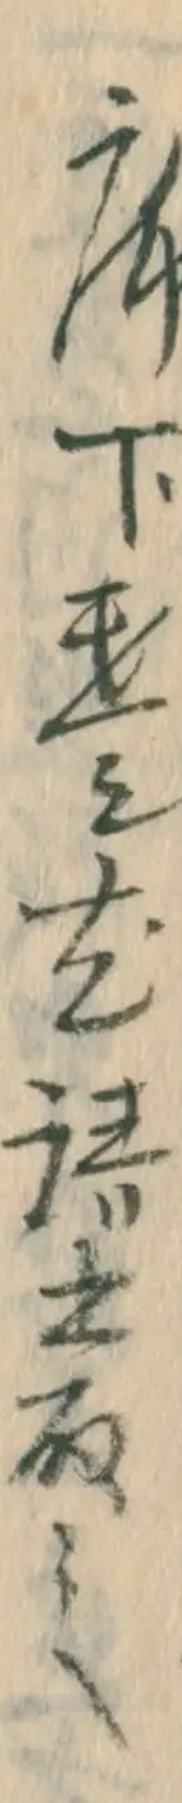序下遣シ尤請書取之

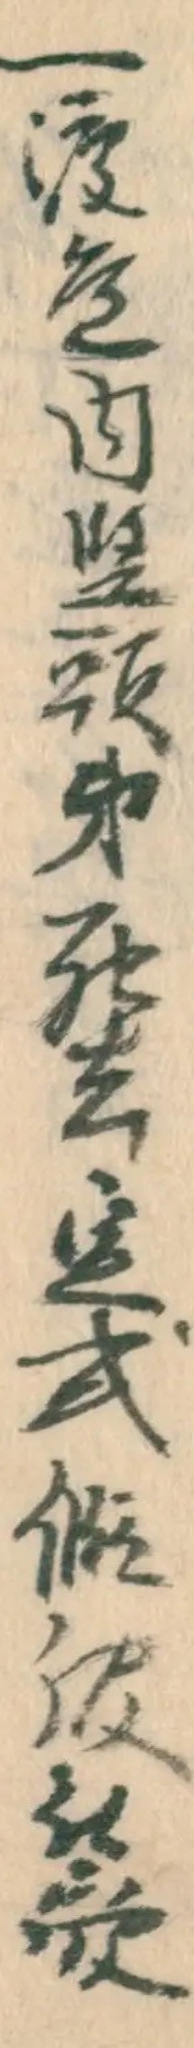一渡辺内監頭弟死去定式仮服被受
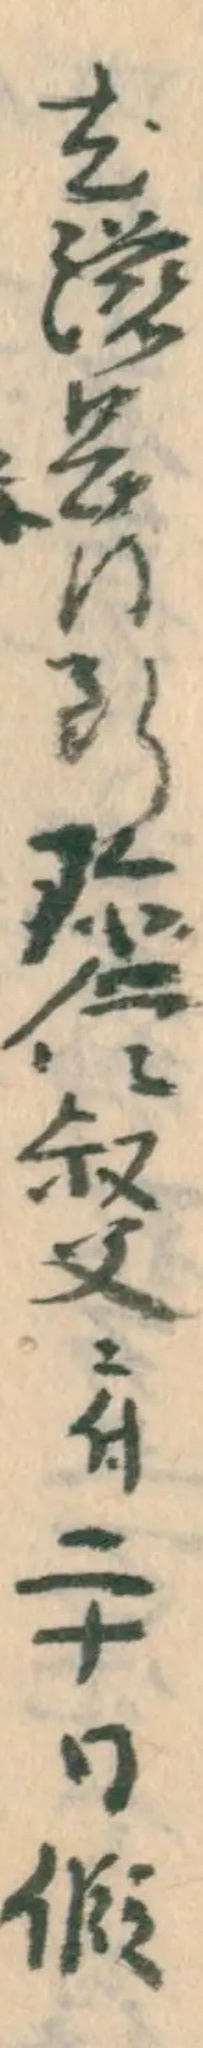尤滋岡同断珍信叔父ニ付二十日仮
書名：禁裏御所御用日記. [131]
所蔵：国立国会図書館 National Diet Library, JAPAN
